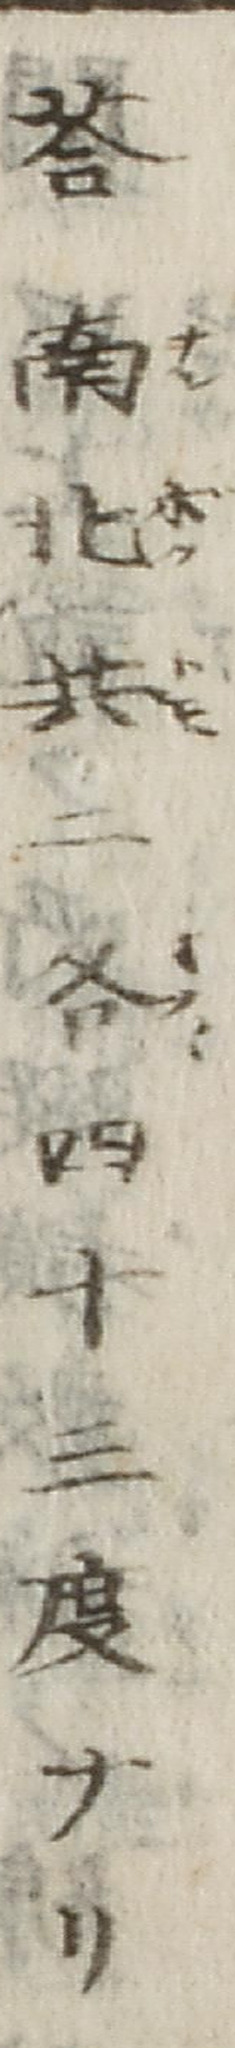答南北共ニ各四十三度ナリ
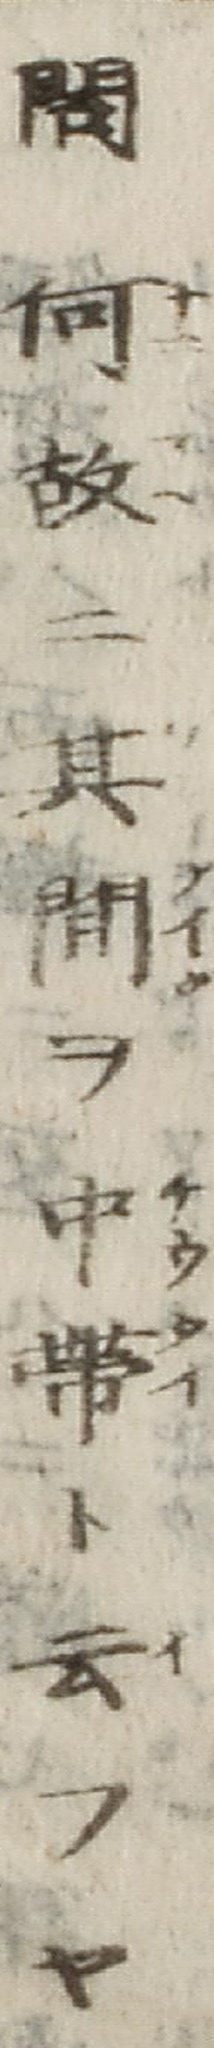問何故ニ其間ヲ中帯ト云フヤ
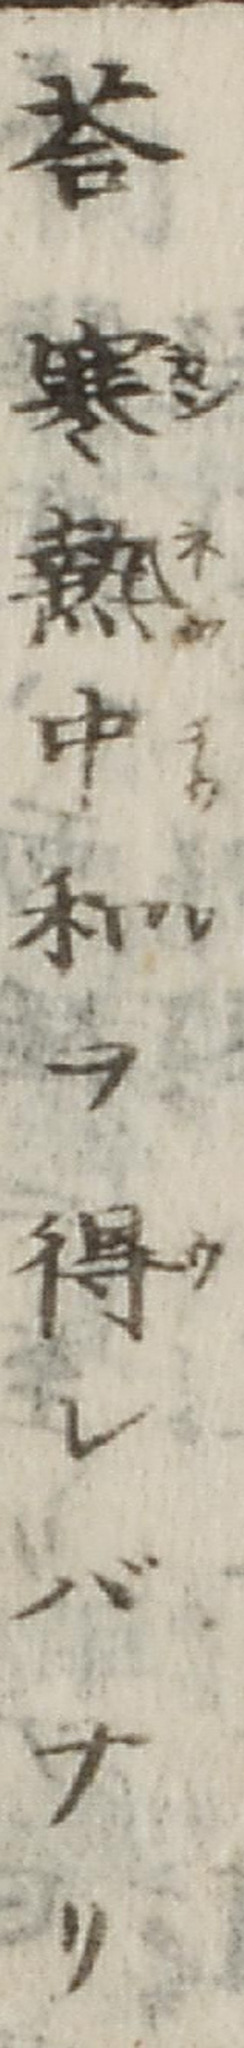答寒熱中和ヲ得レバナリ
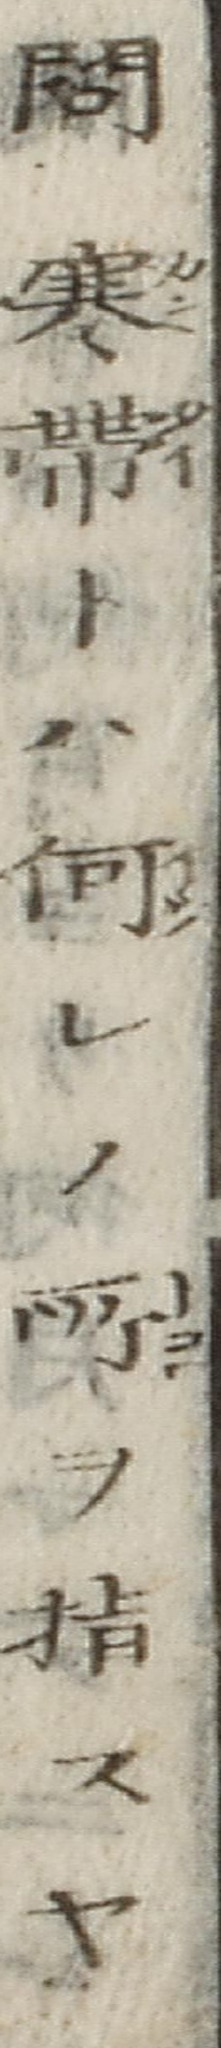問寒帯トハ何レノ所ヲ指スヤ
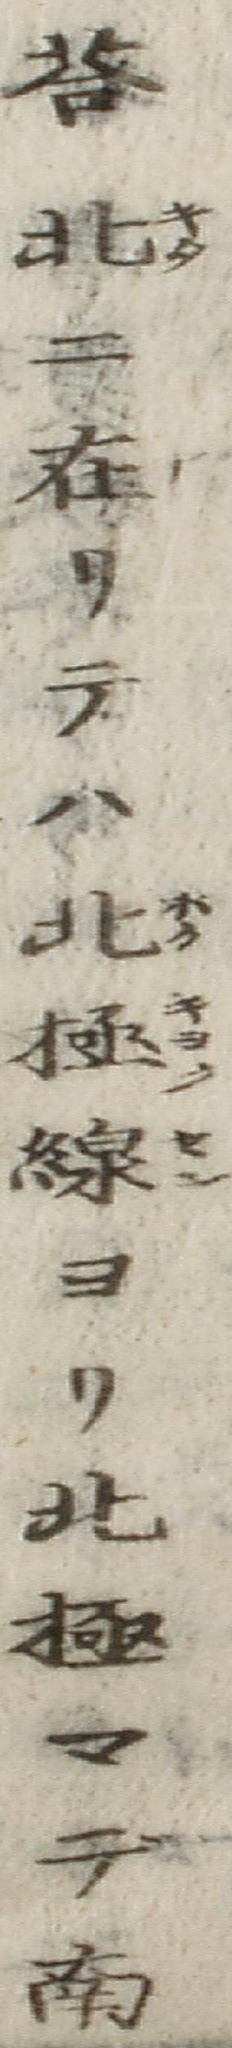答北ニ在リテハ北極線ヨリ北極マデ南
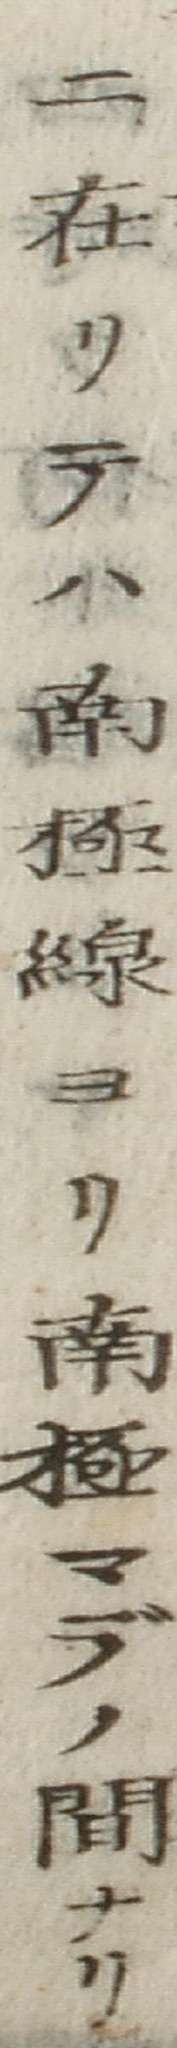ニ在リテハ南極線ヨリ南極マデノ間ナリ
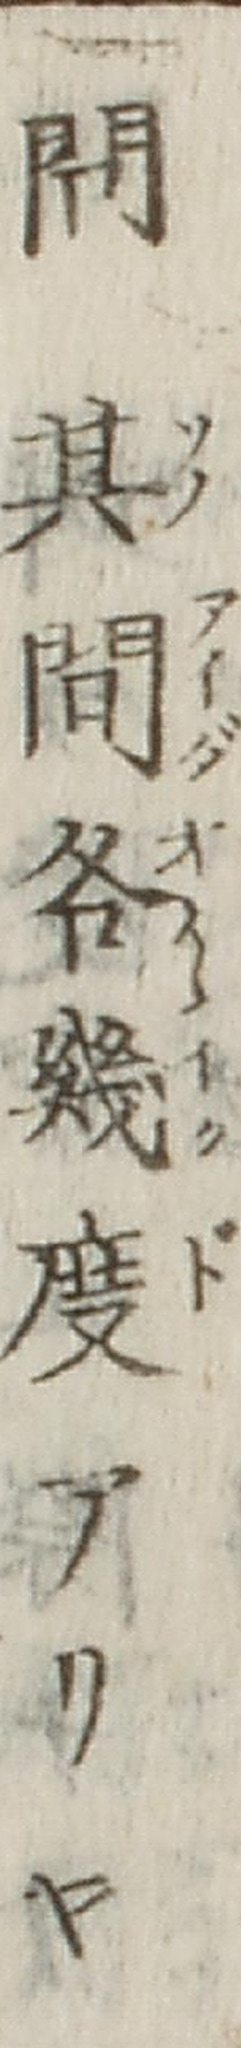問其間各幾度アリヤ
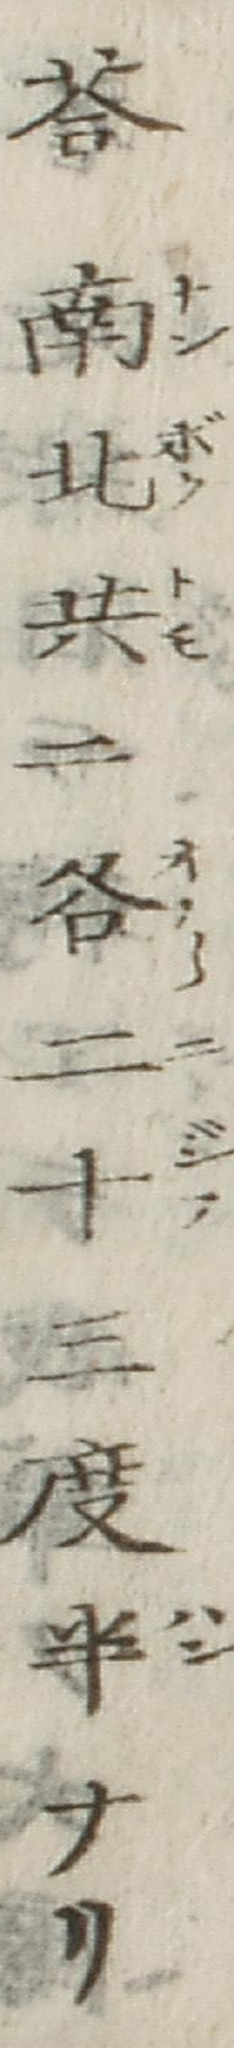答南北共ニ各四十三度ナリ
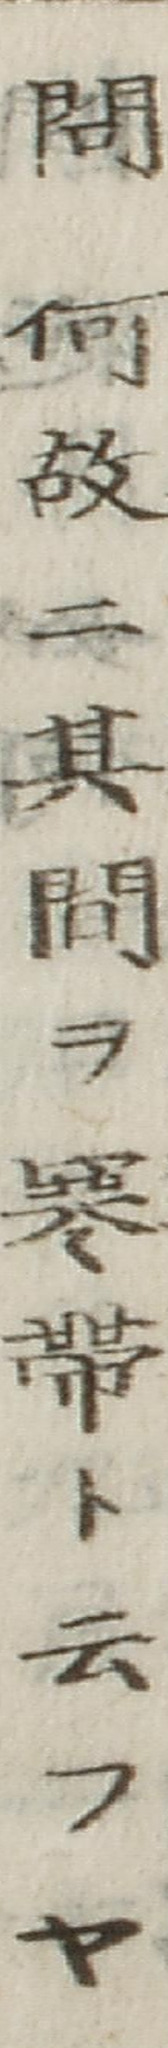問何故ニ其間ヲ寒帯ト云フヤ
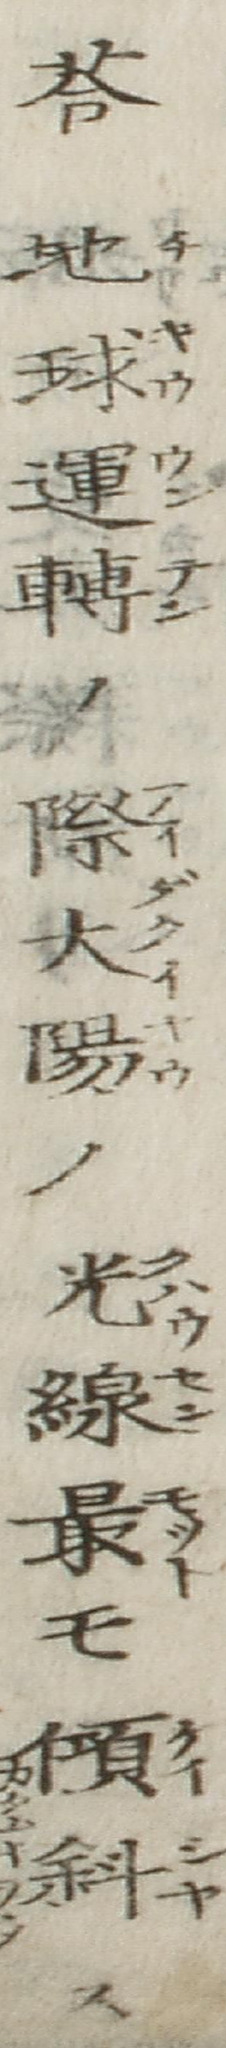答地球運転ノ際大陽ノ光線最モ傾斜ス
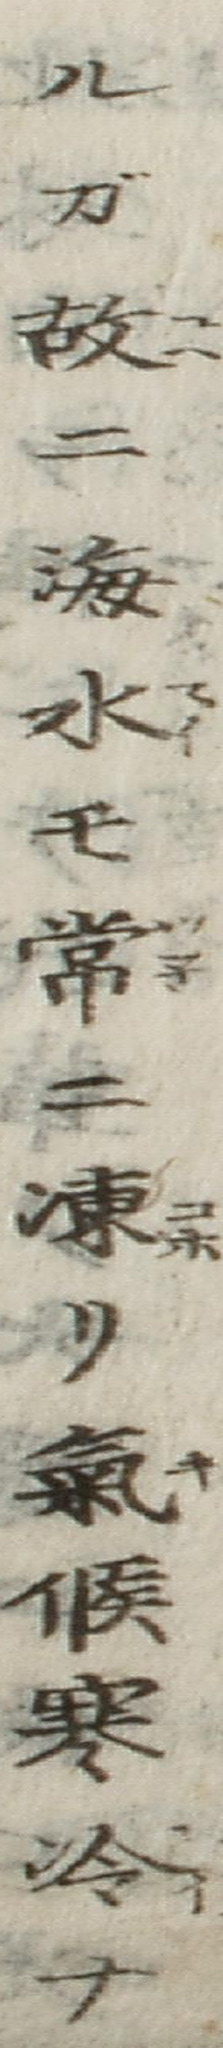ルガ故ニ海水モ常ニ凍リ気候寒冷ナ
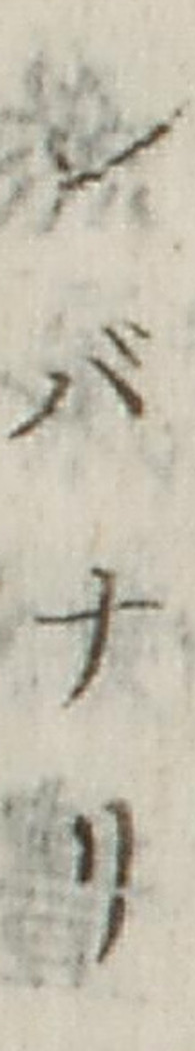レバナリ
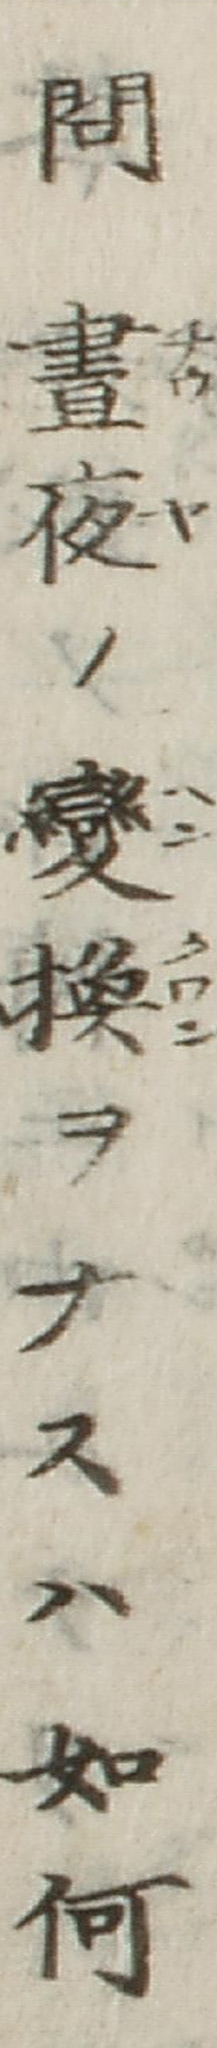問昼夜ノ変換ヲナスハ如何

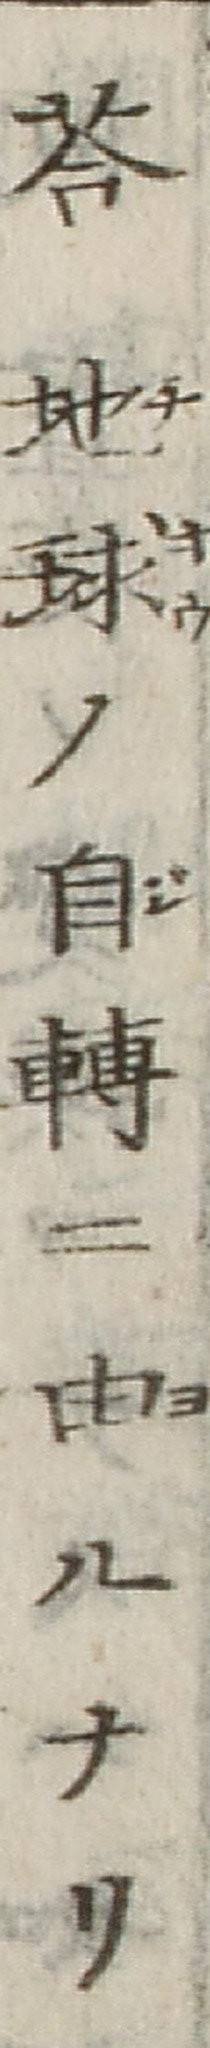答地球ノ自転ニ由ルナリ
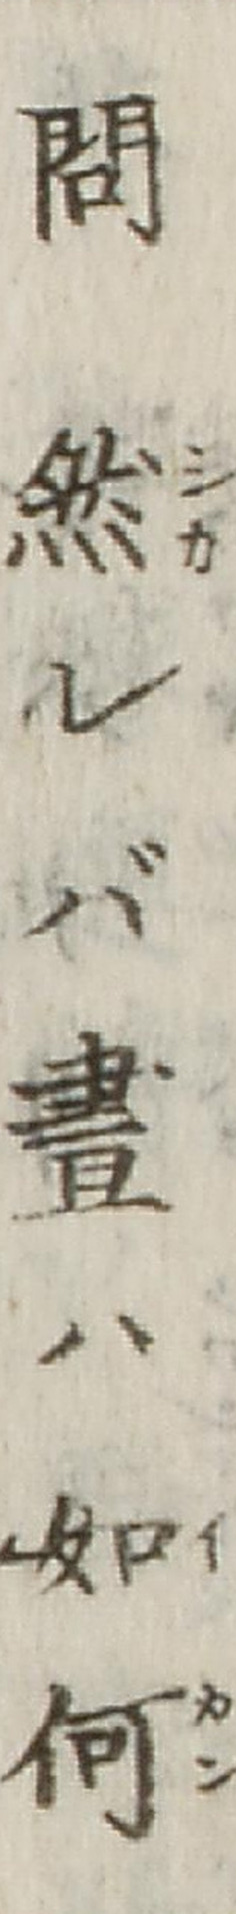問然レバ昼ハ如何
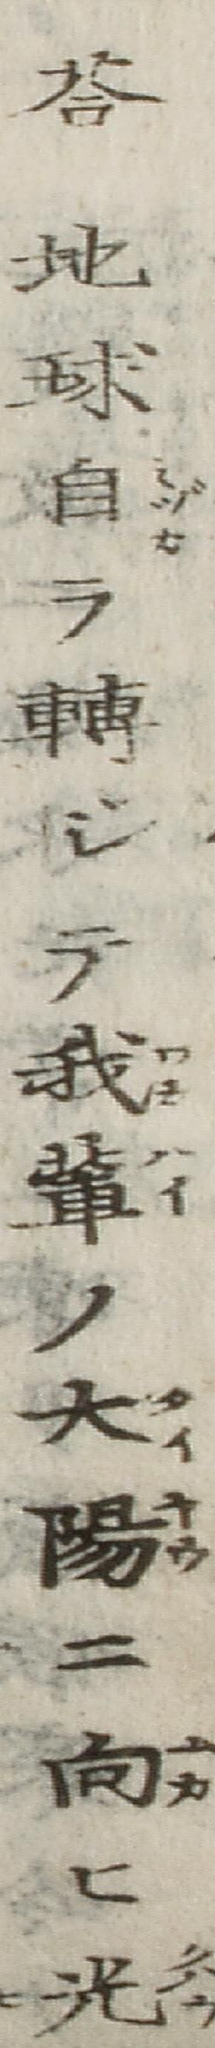答地球自ラ転ジテ吾輩ノ大陽ニ向ヒ光
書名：地球儀問答　全
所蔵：東京大学地震研究所図書室 Earthquake Research Institute Library, The University of Tokyo, JAPAN
